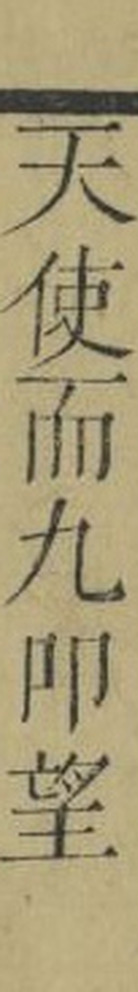天使而九叩望
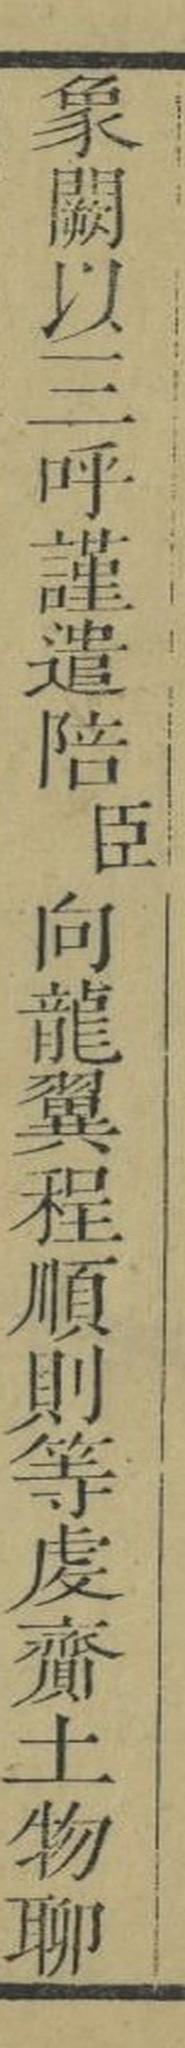象闕以三呼謹遣陪臣向龍翼程順則等虔齎土物聊
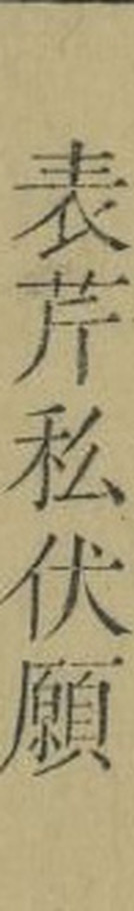表芹私伏願
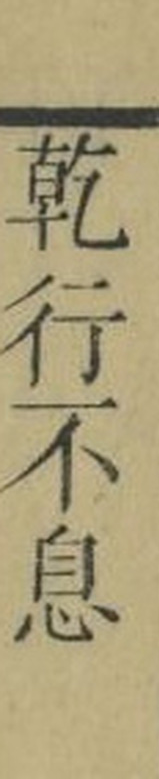乾行不息
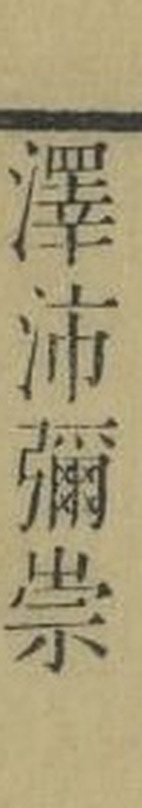澤沛彌崇
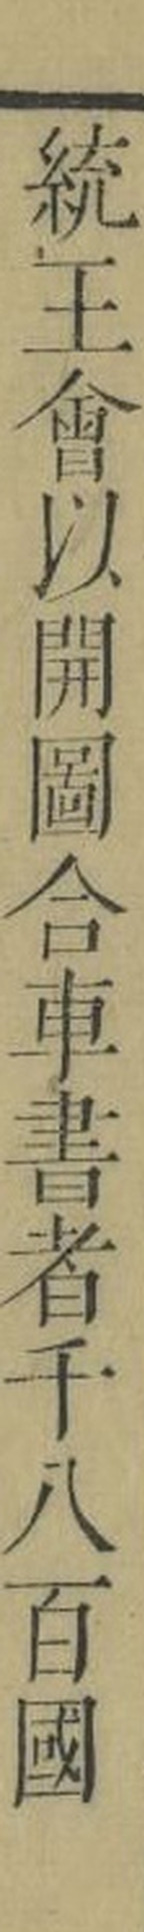統王會以開圖合車書者千八百國
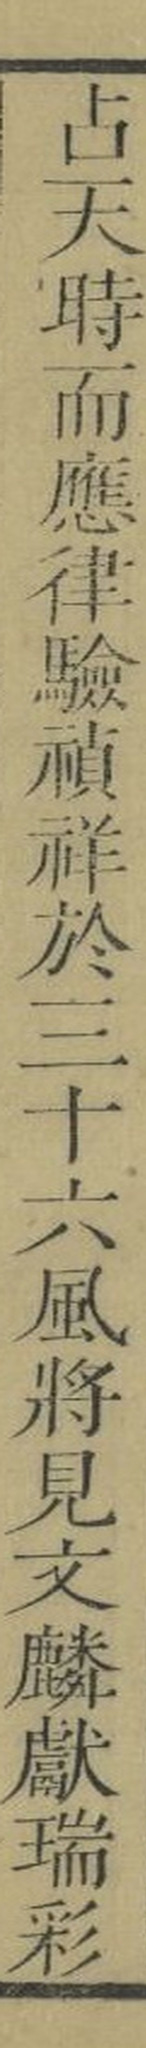占天時而應律驗禎祥於三十六風將見文麟獻瑞彩
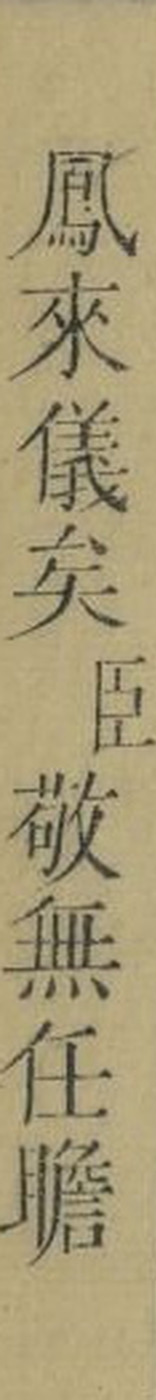鳳來儀矣臣敬無任瞻

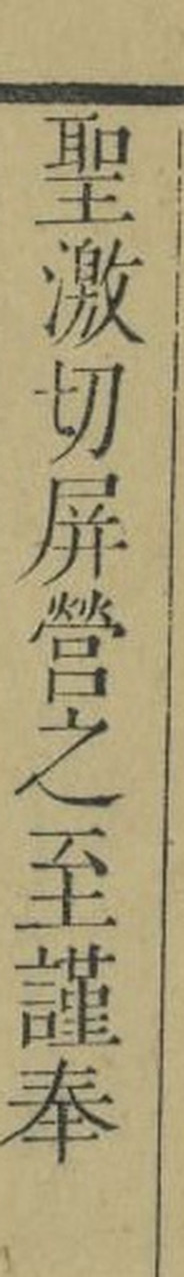聖激切屏營之至謹奉
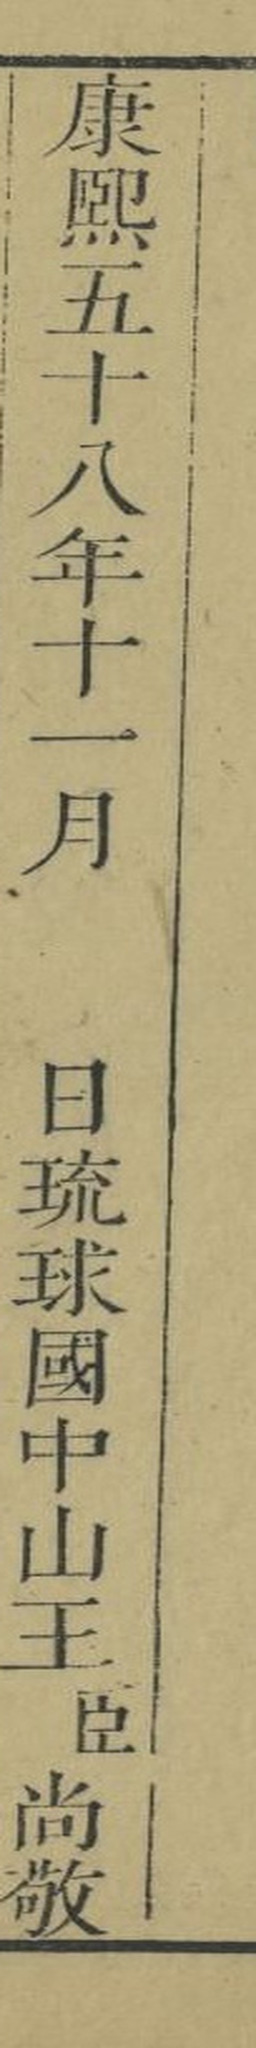康煕五十八年十一月日琉球國中山王臣尚敬
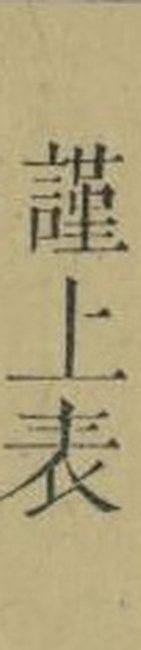謹上表
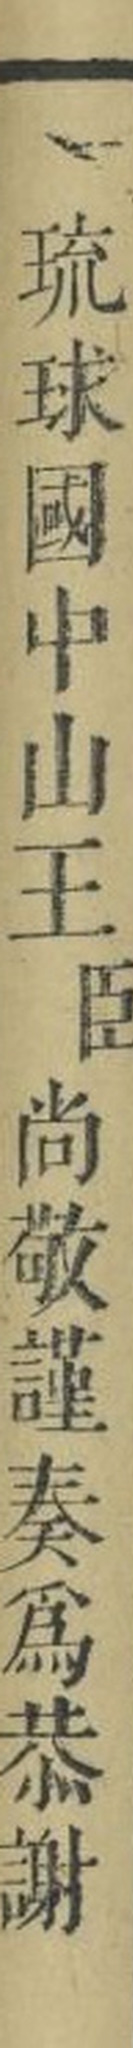琉球國中山王臣尚敬謹奏爲恭謝
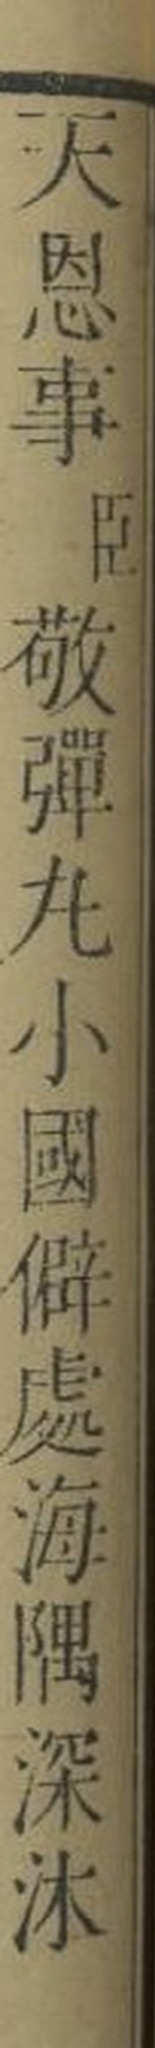天恩事臣敬彈丸小國僻處海隅深沐
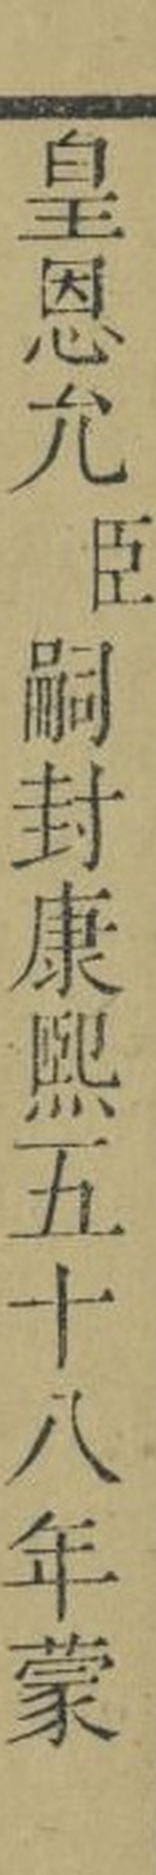皇恩允臣嗣封康煕五十八年蒙
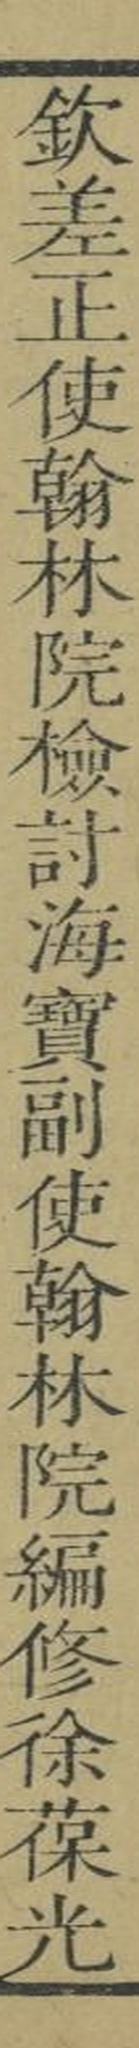欽差正使翰林院檢討海寶副使翰林院編修徐葆光
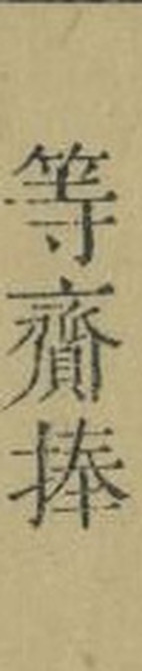等齎捧
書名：中山伝信録 巻二
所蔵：University of the Ryukyus Library
